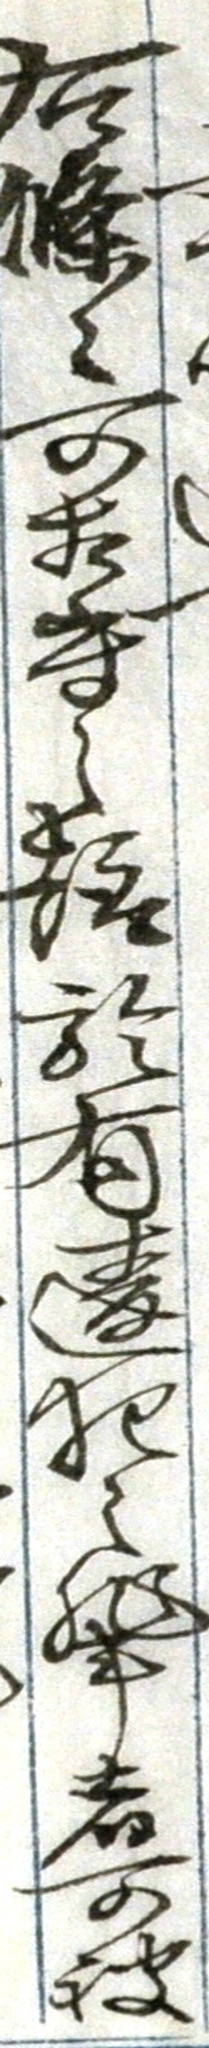右條々可相守之趣於有違犯之輩は可被
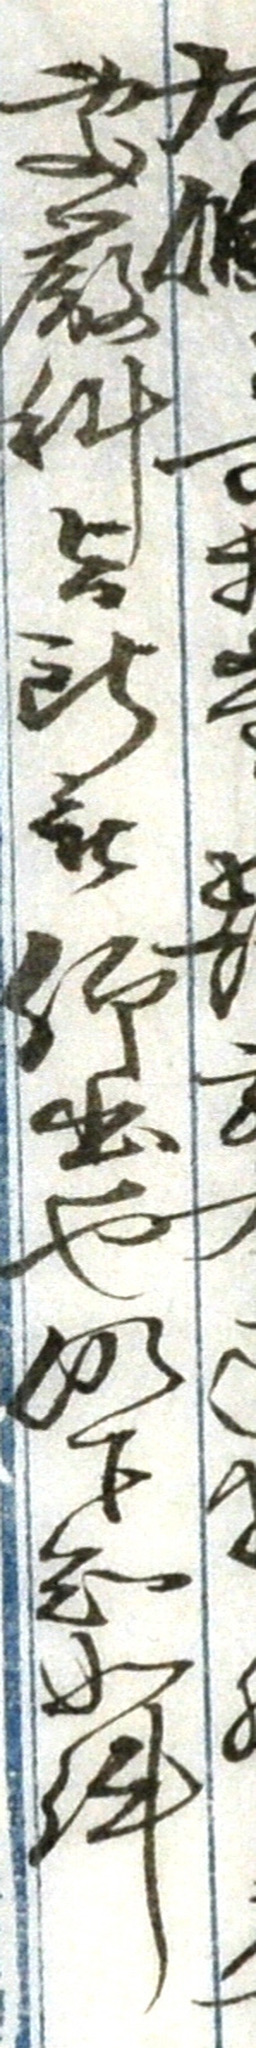処厳科旨所被仰出也仍下知如件
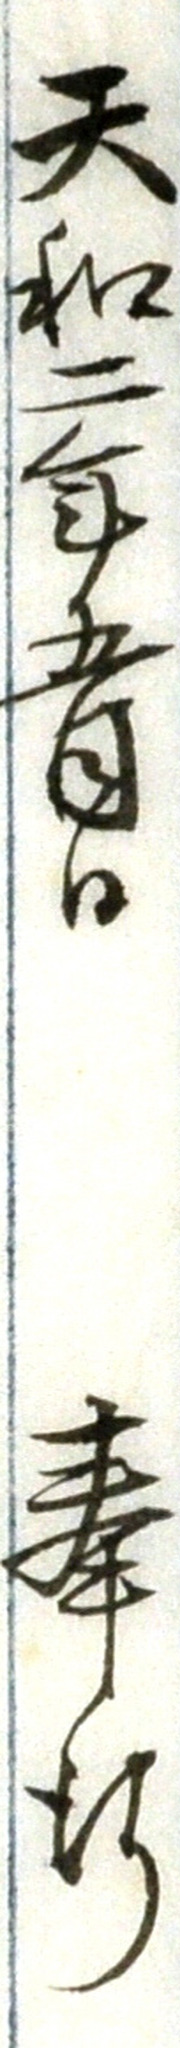天和二年五月日奉行

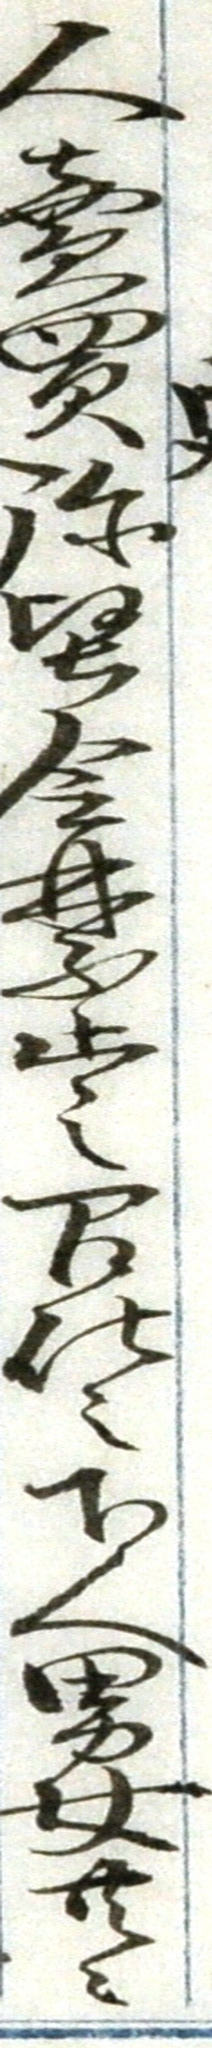人売買弥堅令禁止之召仕之下人男女共々
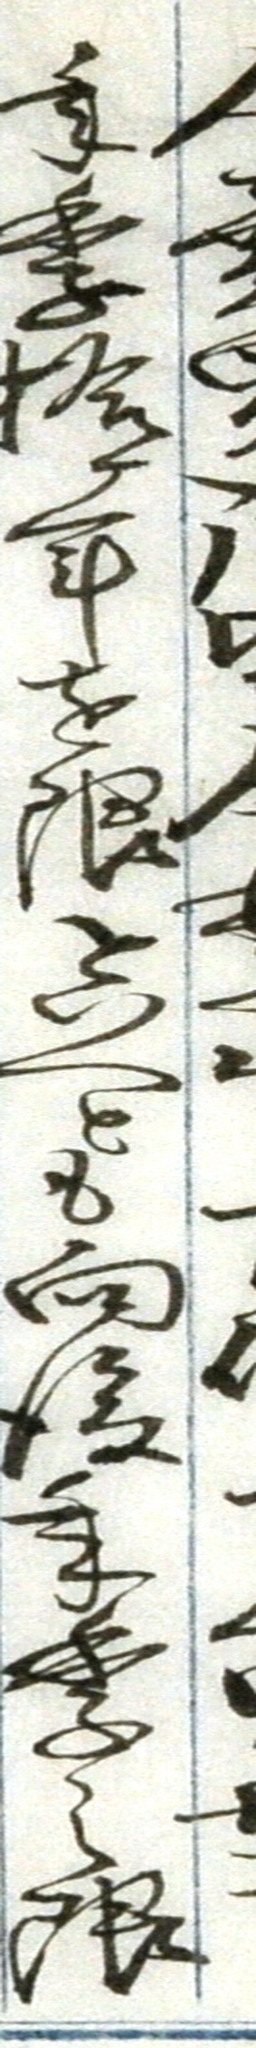年季十ヶ年を限といへとも向後年季之限
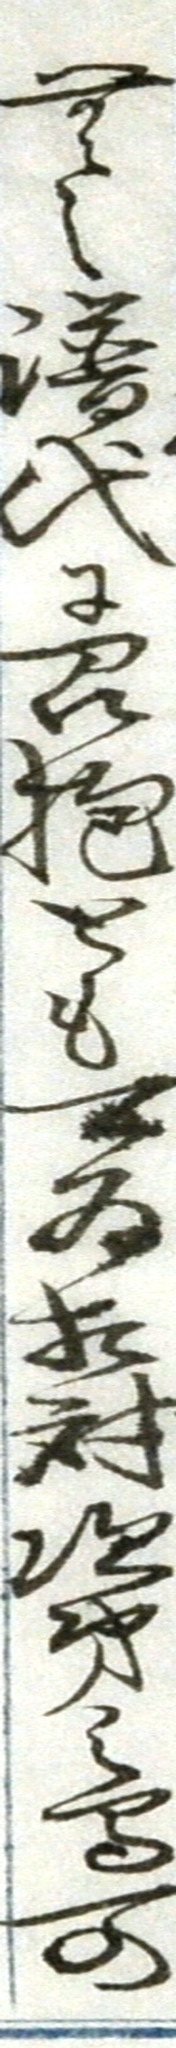無之譜代に召抱とも不為相対次第之間可
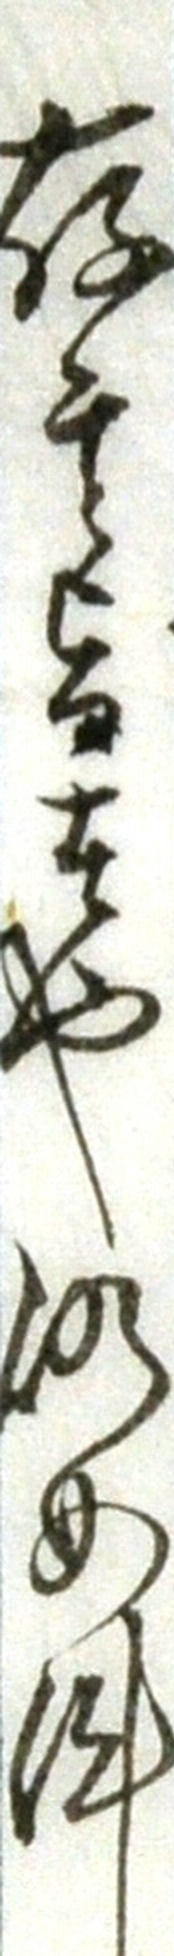存其旨者也仍如件
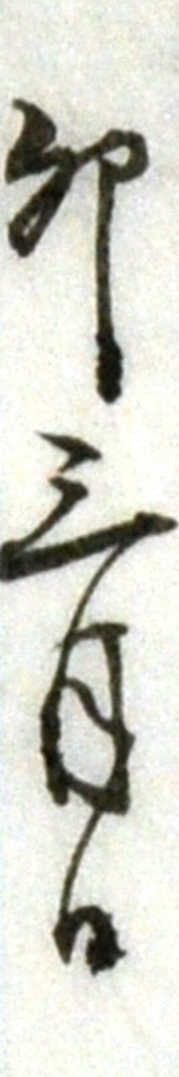卯三月日
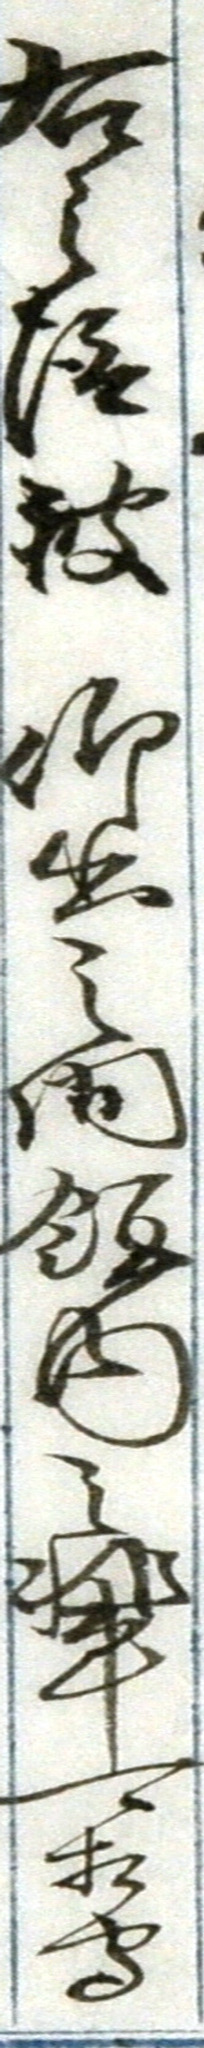右之趣被仰出之間領内之輩可相守
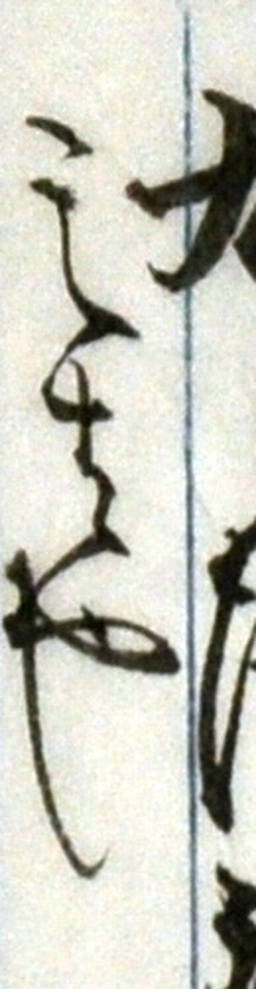之者也

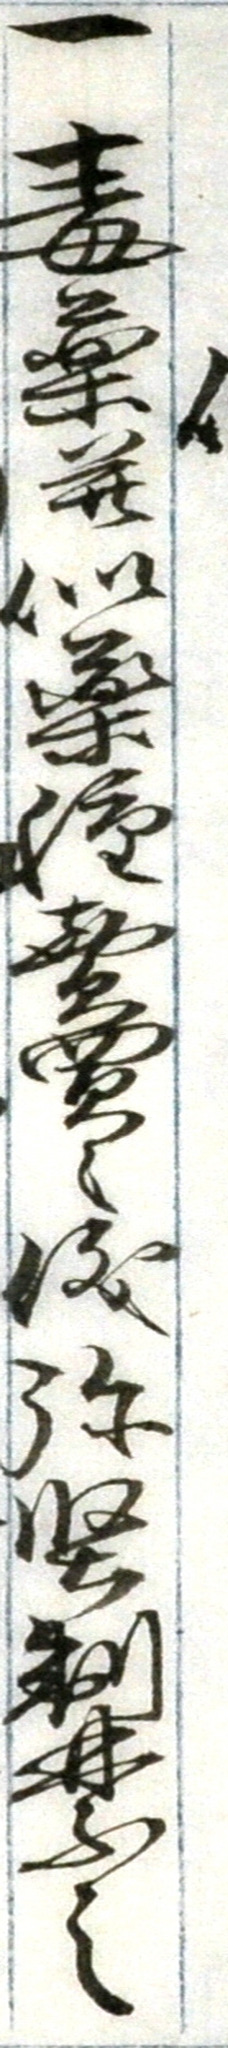一毒薬幷似薬種売買之儀弥堅制禁之
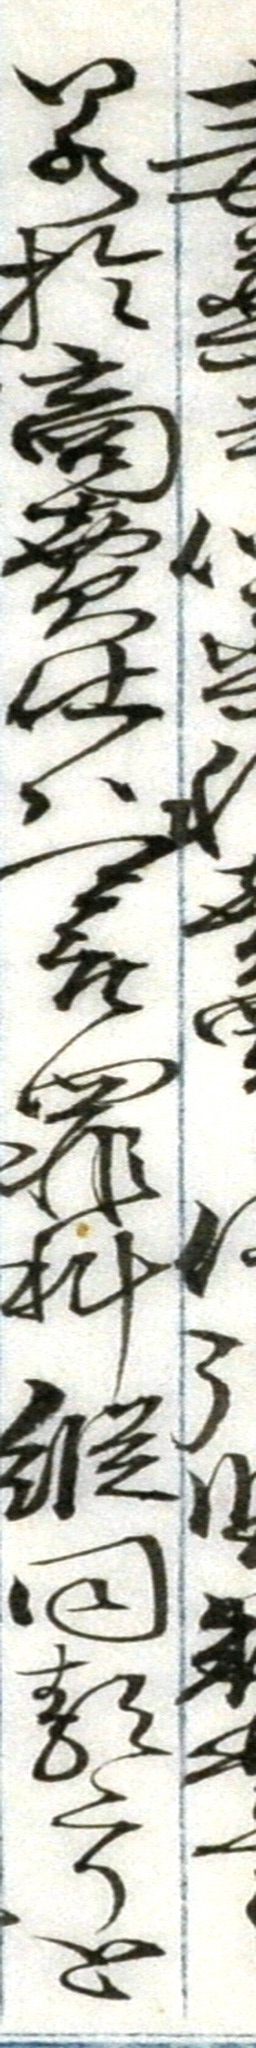若於商売仕は可被罪科縦同類たりと
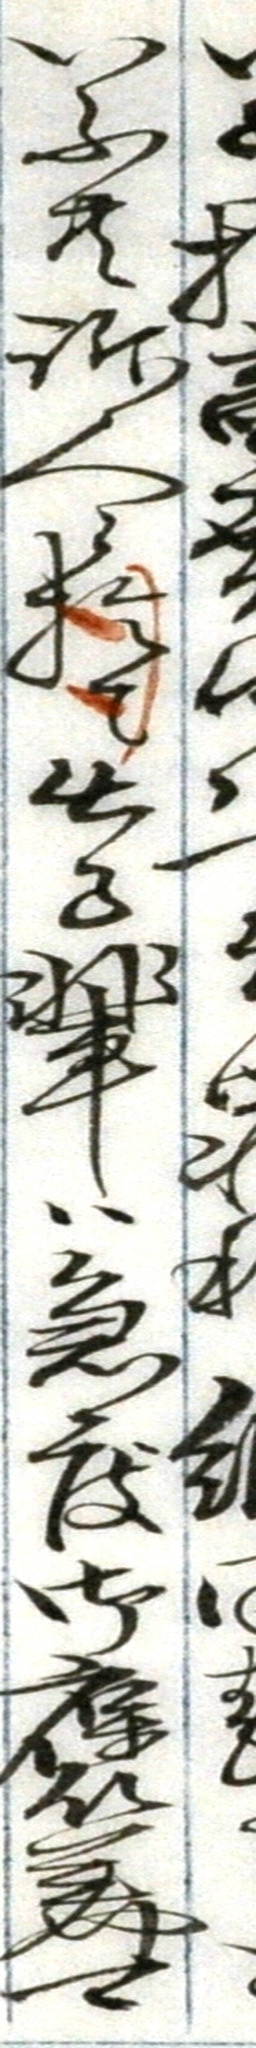いふ共訴人に於て出る輩は急度御褒美可
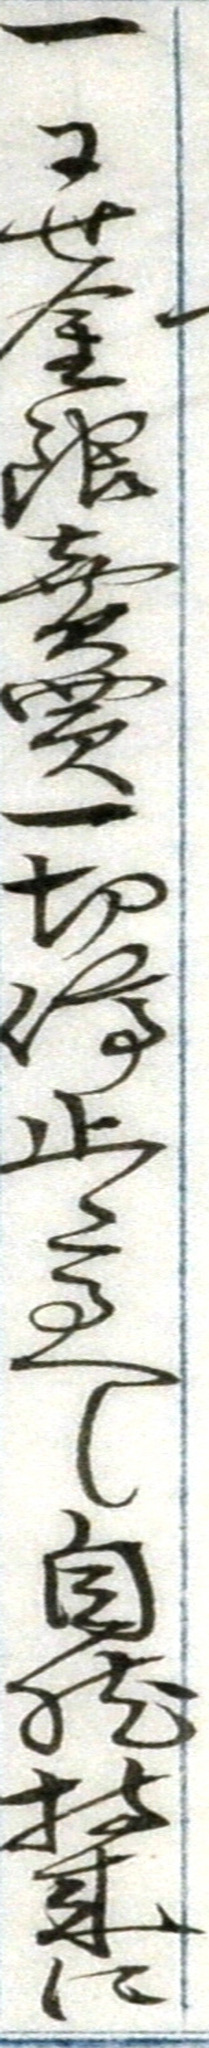一にせ金銀売買一切停止たるへし自然持来に
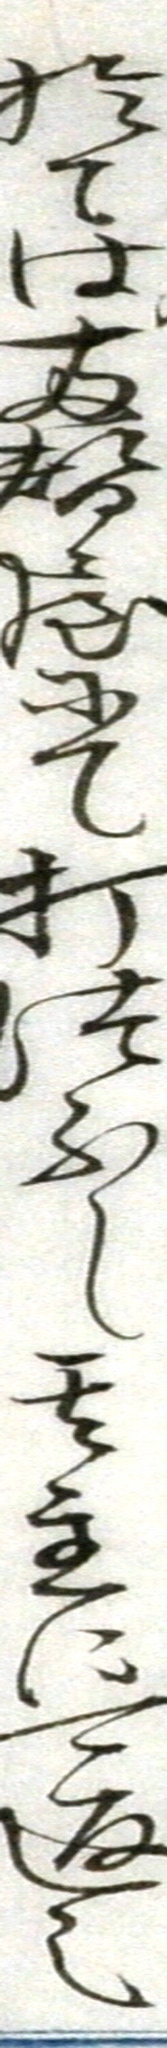於ては両替屋にて打つふし其主に可返之
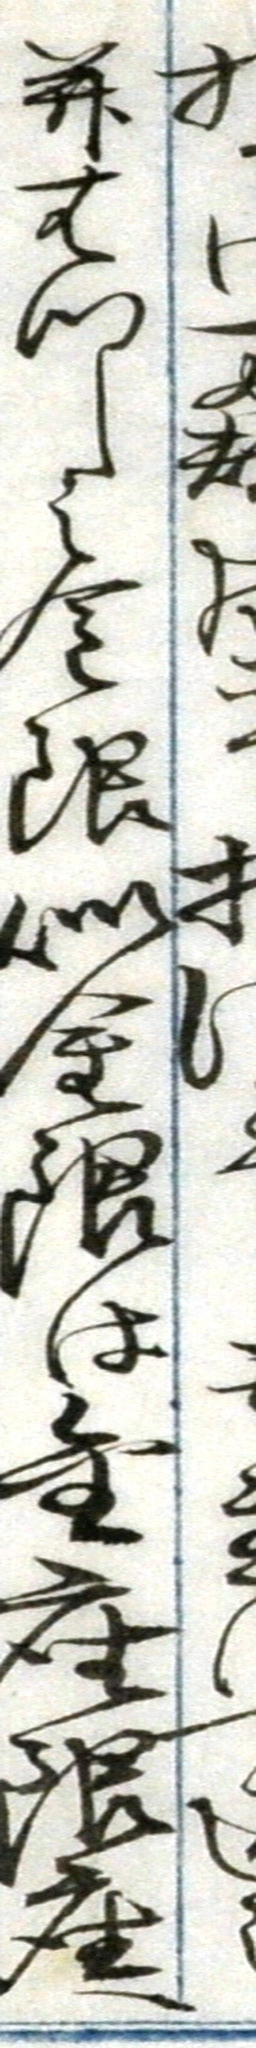幷はつし之金銀似金銀は金座銀座へ
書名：御高札之写
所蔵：伊那市立高遠町図書館・合同会社AMANE
